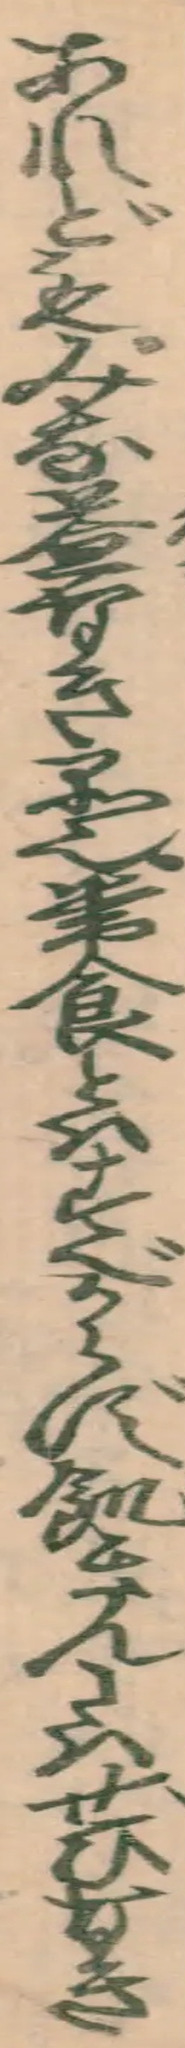あれども．みな益なき品也．常食とはすべからず飢きんにはぜひなき
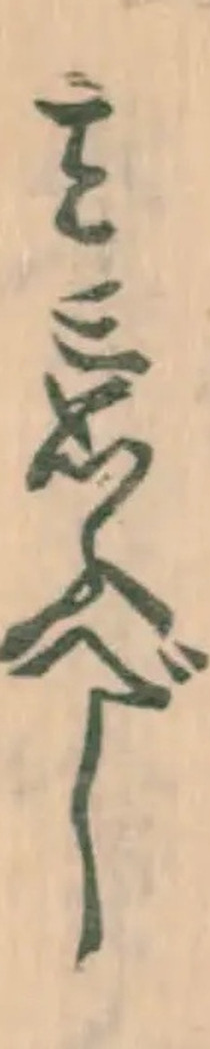こと思ふべし
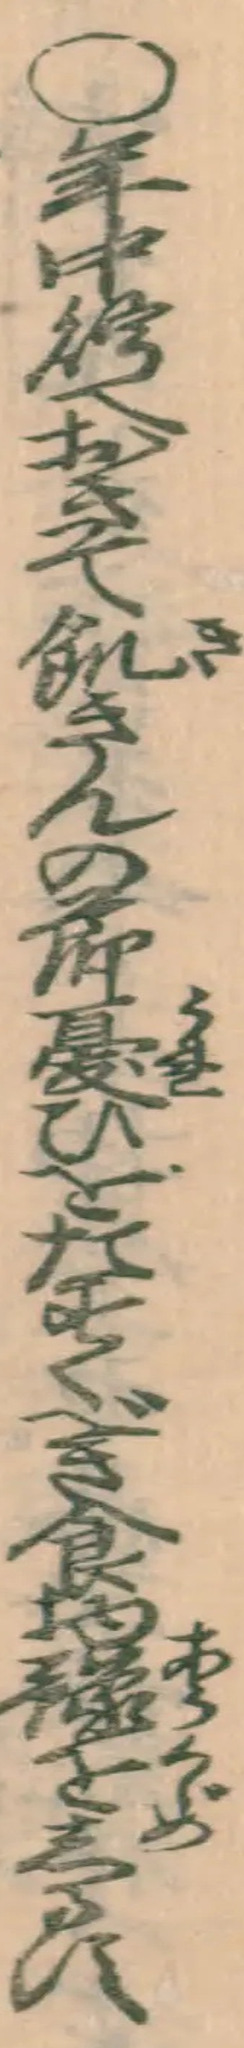○年中貯へおきて飢きんの節憂ひをたすくべき食物予をしるす
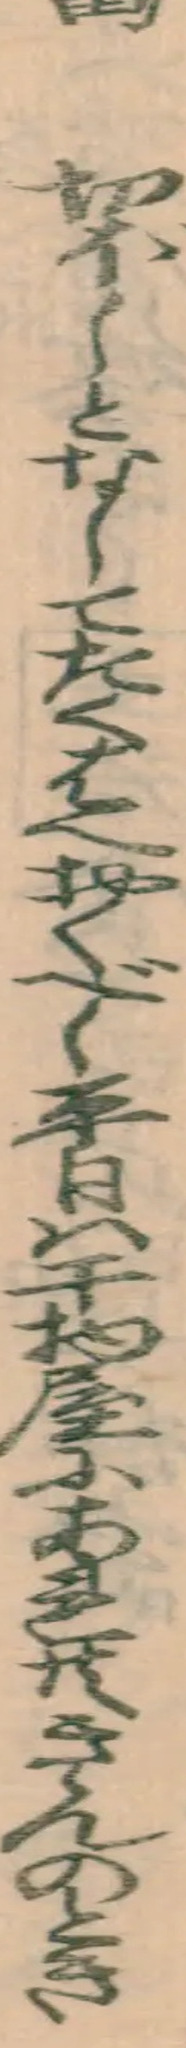蘿蔔切ぼしとなしてたくはへおくべし平日は干物屋にあれ共きゝんのとき
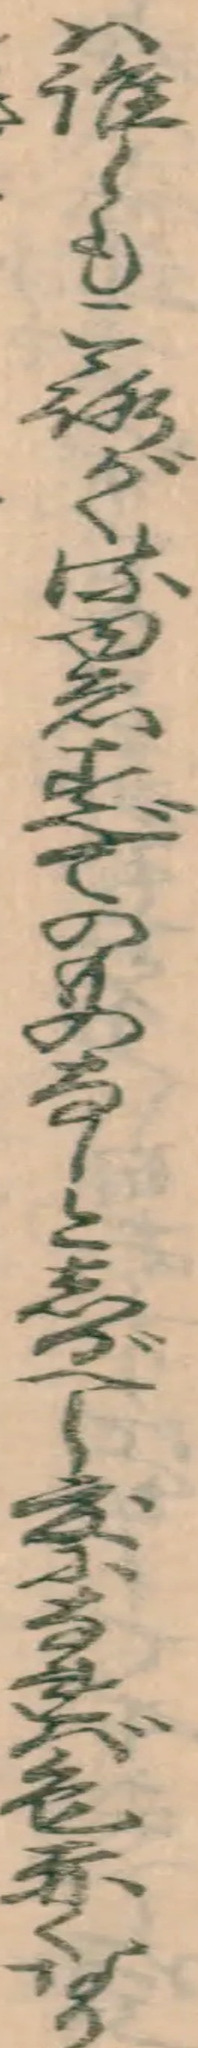は誰しもこゝろがくるゆゑすべてのものなしとしるべし夏になれば色赤くなり
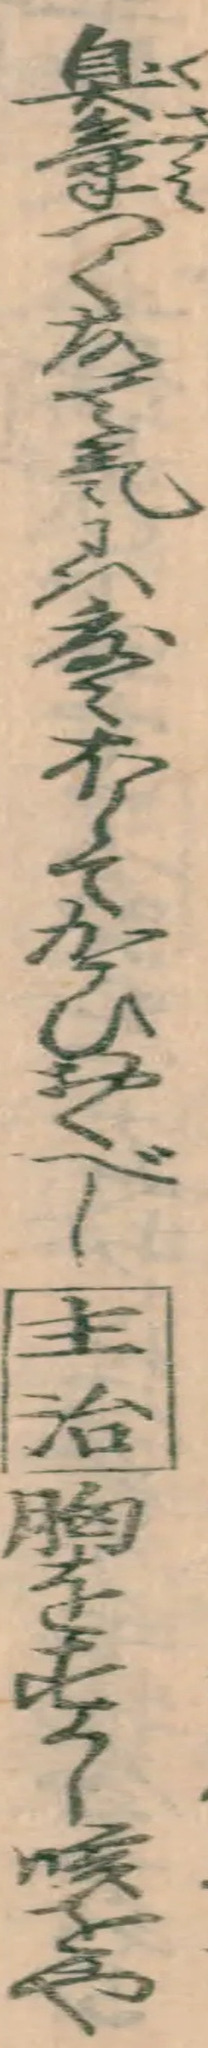臭気つく故天気には度々ほしてかこひおくべし[主治]胸をすかし咳をや
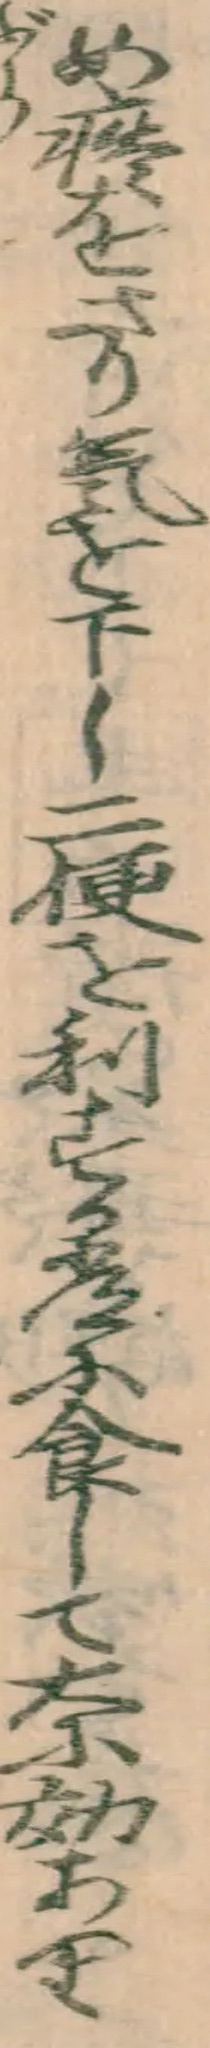め痰をさり気を下し二便を利する常に食して大に効あり
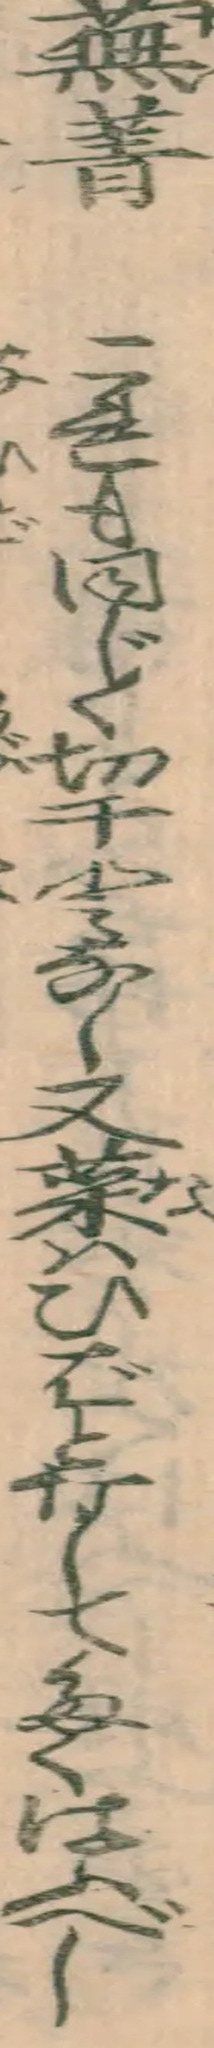蕪菁これも同じく切干となし又菜はひばとなしてたくはふべし
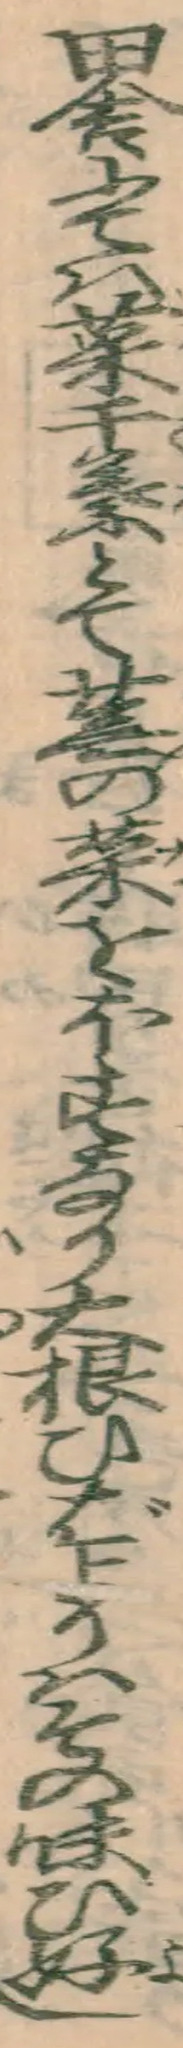田舎にては菜干葉とて蕪の菜をほすなり大根ひばよりはその味ひ好し
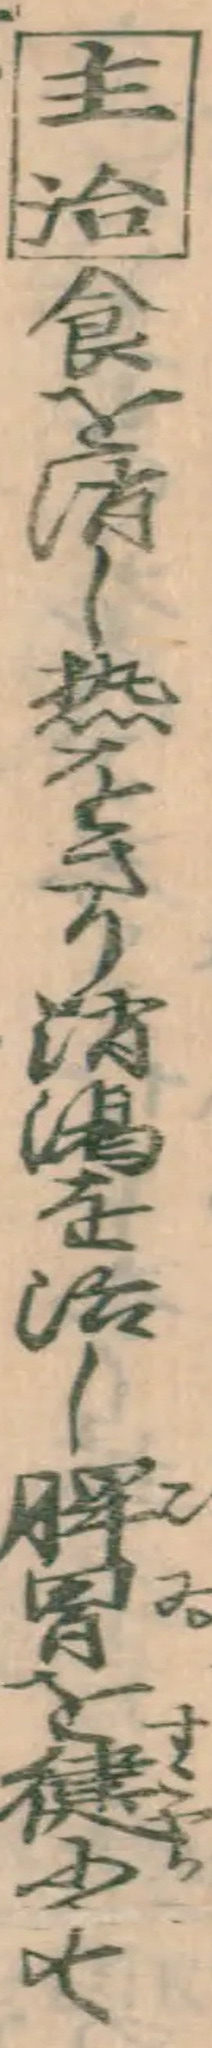[主治]食を消し熱をさり消渇を治し脾胃を健にす
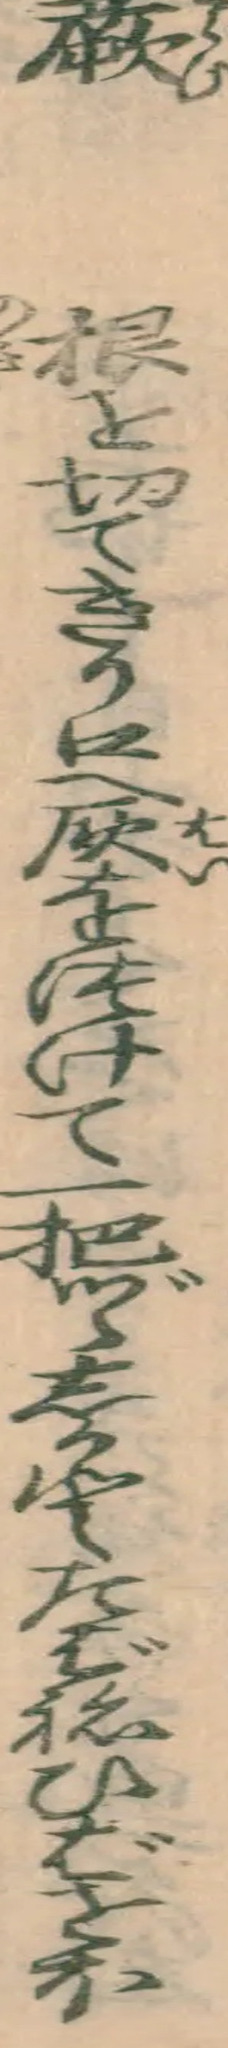蕨根を切てきり口へ灰をつけて一把づゝしかとたばねひばをほ
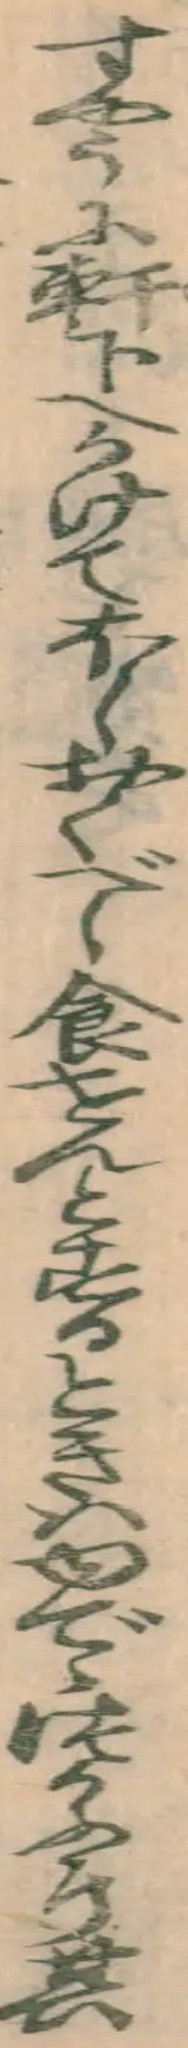すやうに軒下へかけてほしおくべし食せんとするときはゆでゝつかふに其
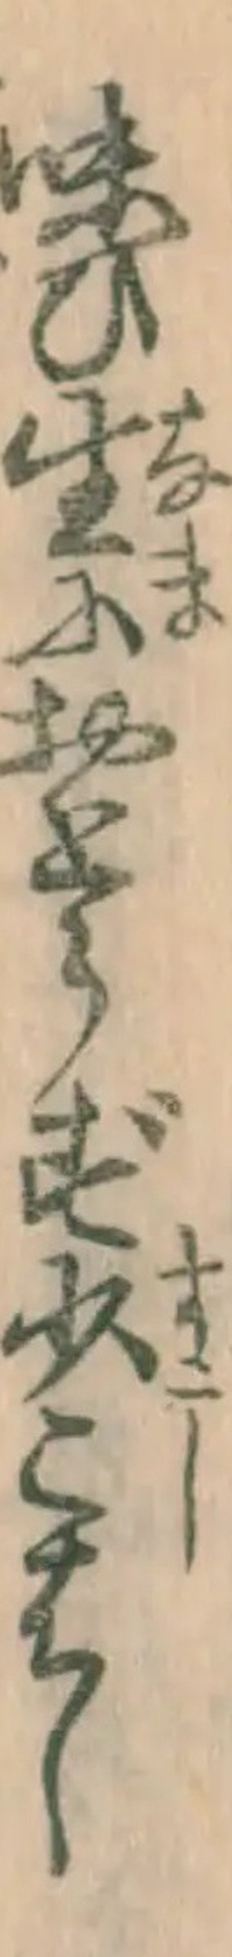味ひ生におとらず少こはし
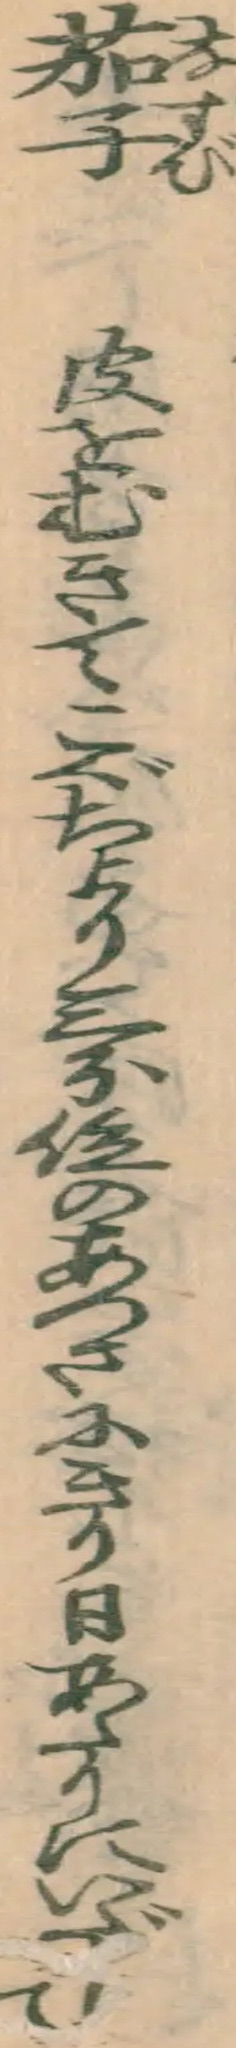茄子皮をむきてこぐちより三分位のあつさにきり日あたりにいだして

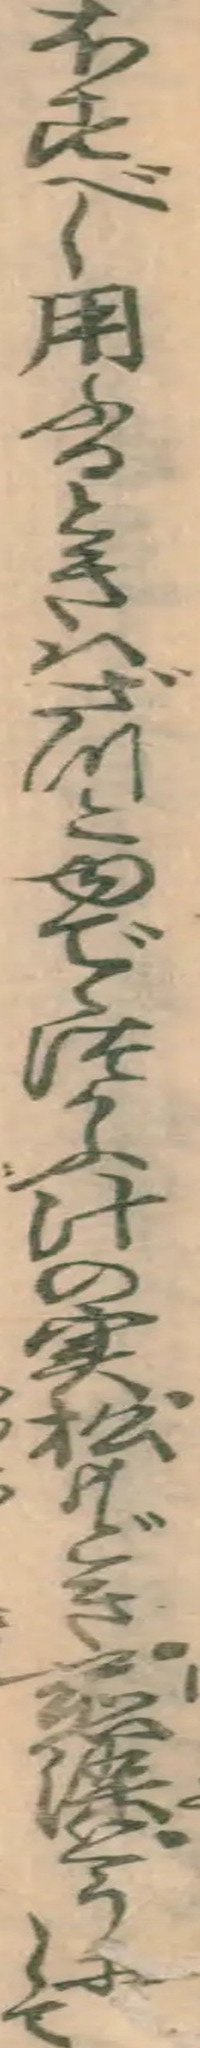ほすべし用ふるときはざつとゆでゝつかふ汁の実．松もどき．煎染．とうにして
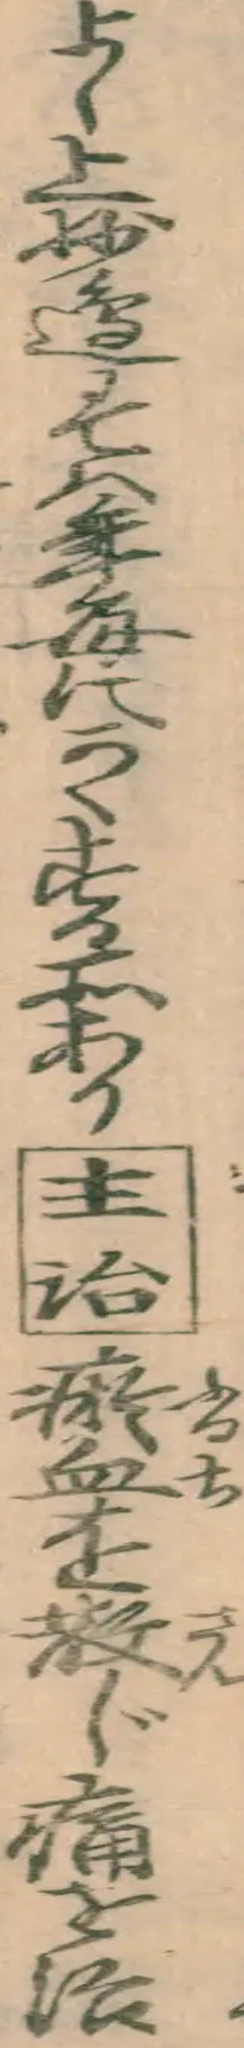よし上州辺にては年毎にかくする所あり[主治]瘀血を散じ痛を治
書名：日ごとの心得
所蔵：国立国会図書館 National Diet Library, JAPAN
